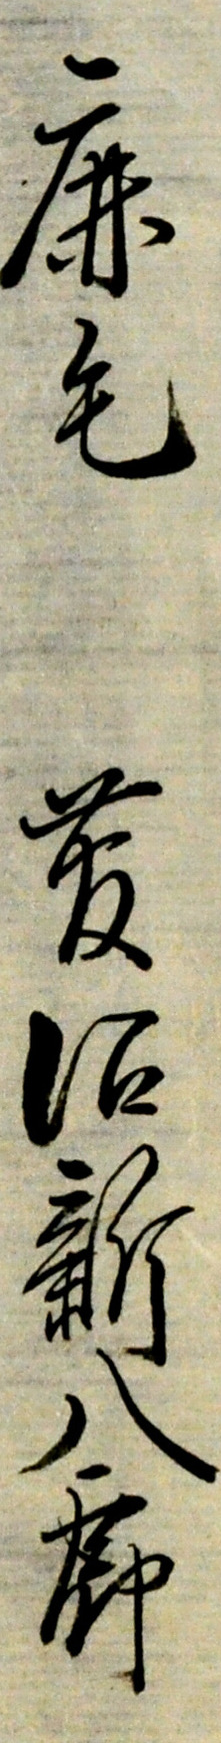鹿毛菅沼新八郎
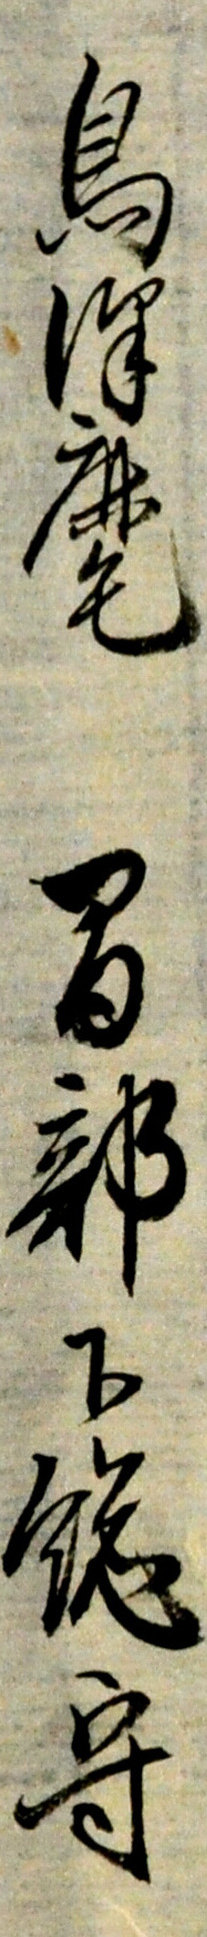鳥沢鹿毛間部下総守
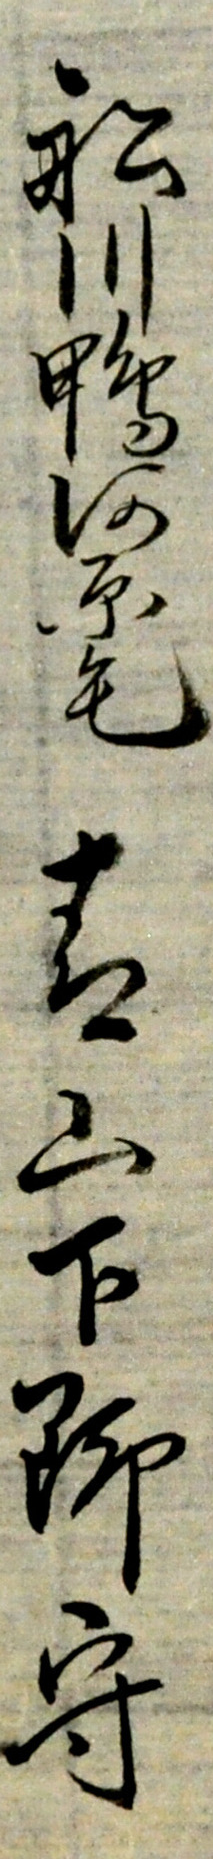船川鴨河原毛青山下野守

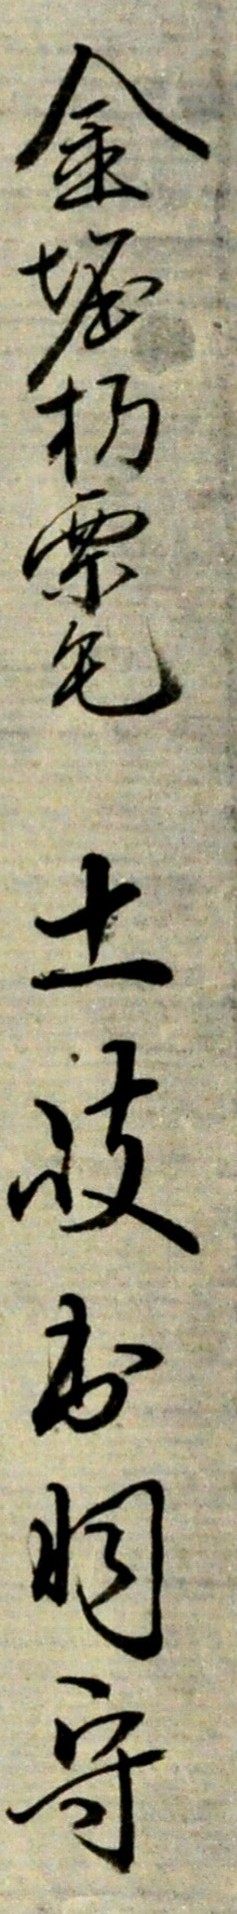金堀栃栗毛土岐出羽守
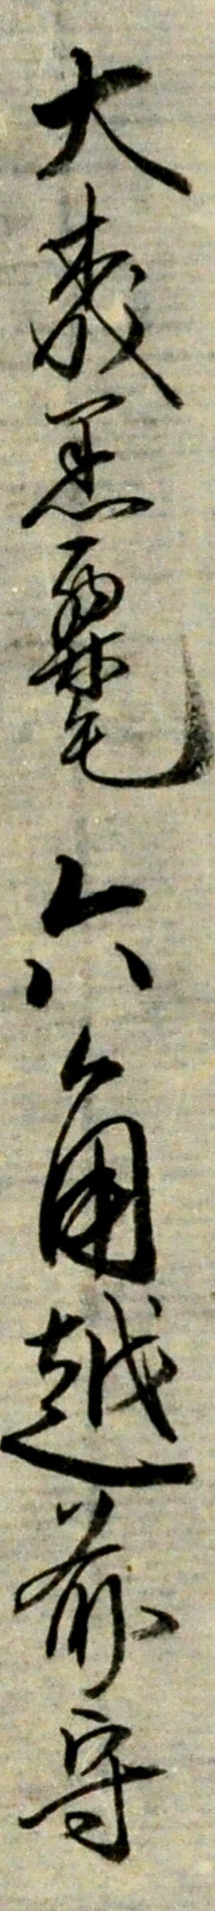大森黒栗毛六角越前守
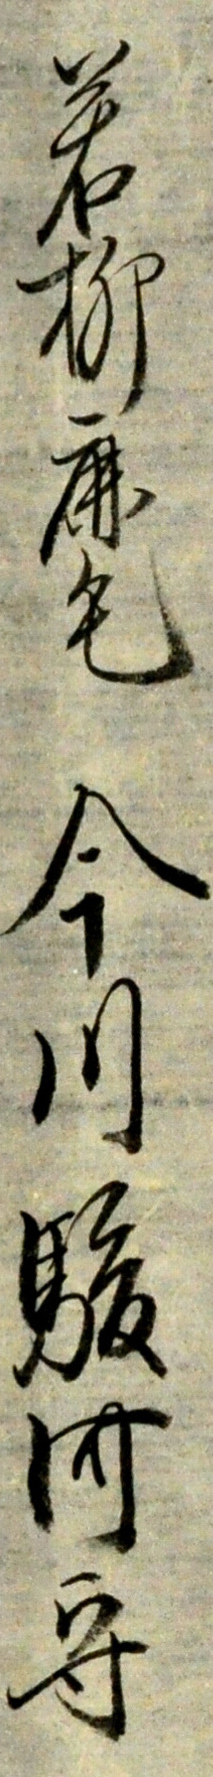若柳鹿毛今川駿河守
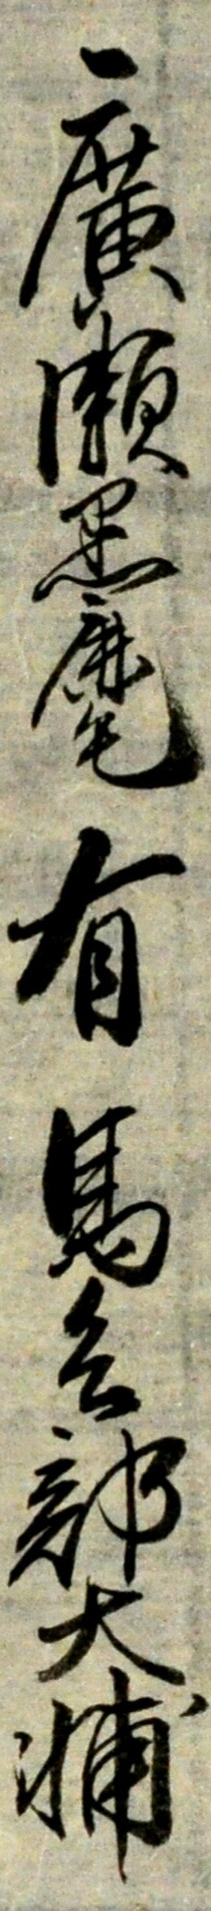広瀬黒鹿毛有馬兵部大輔
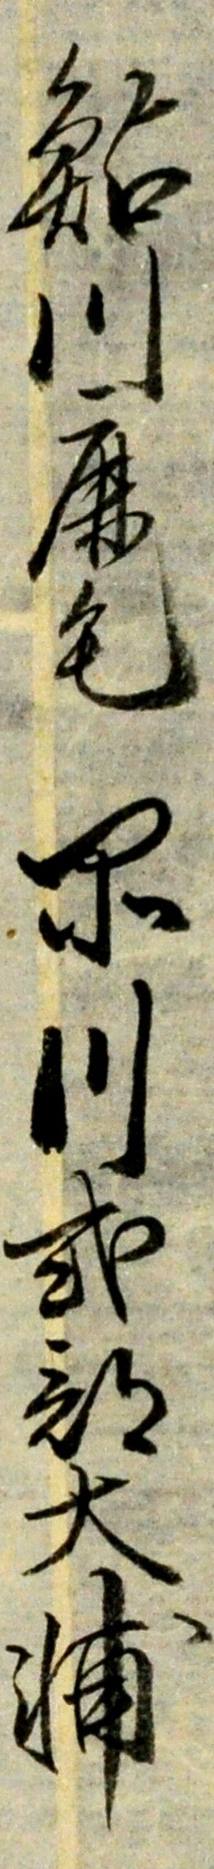鮎川鹿毛品川式部大輔
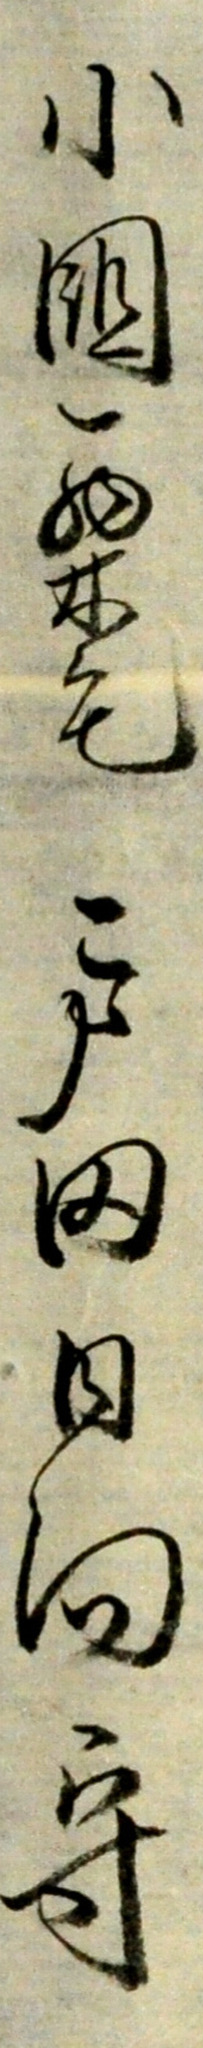小国栗毛戸田日向守
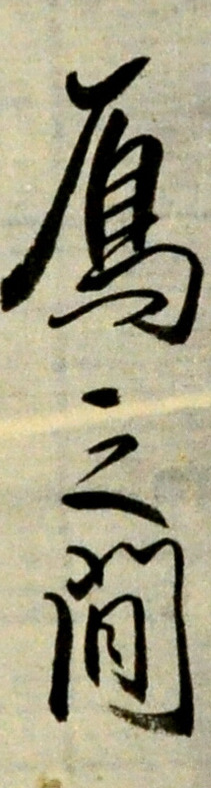雁之間
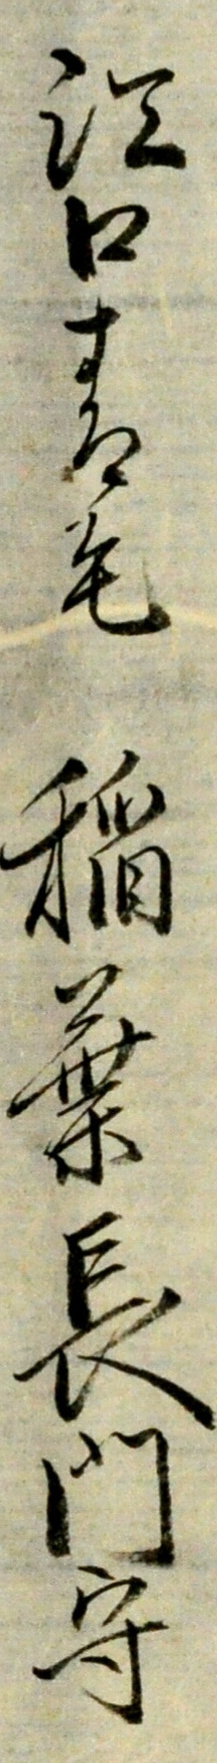江口青毛稲葉長門守
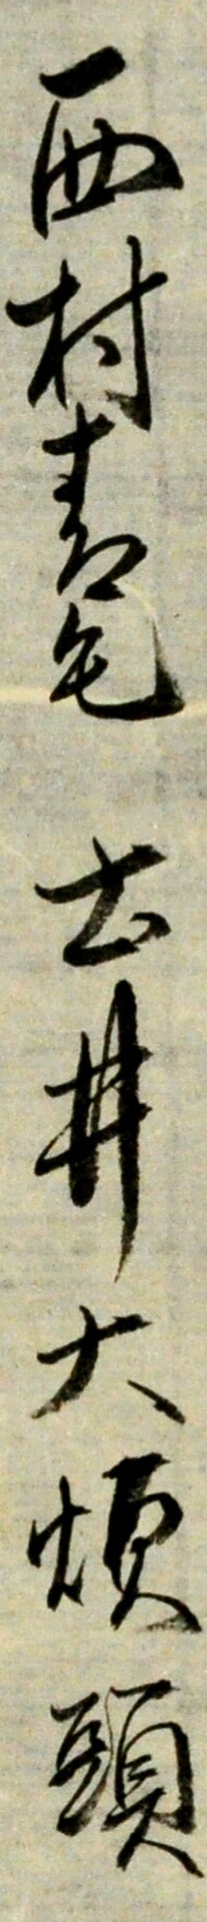西村青毛土井大炊頭
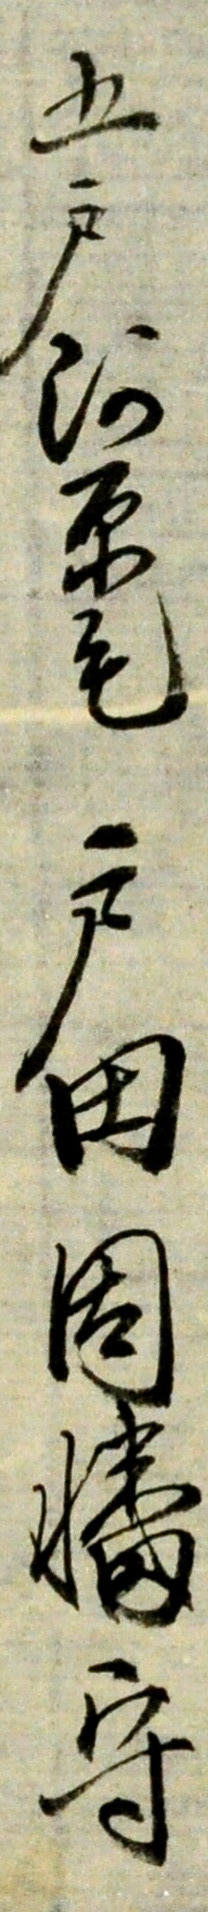五戸河原毛戸田因幡守
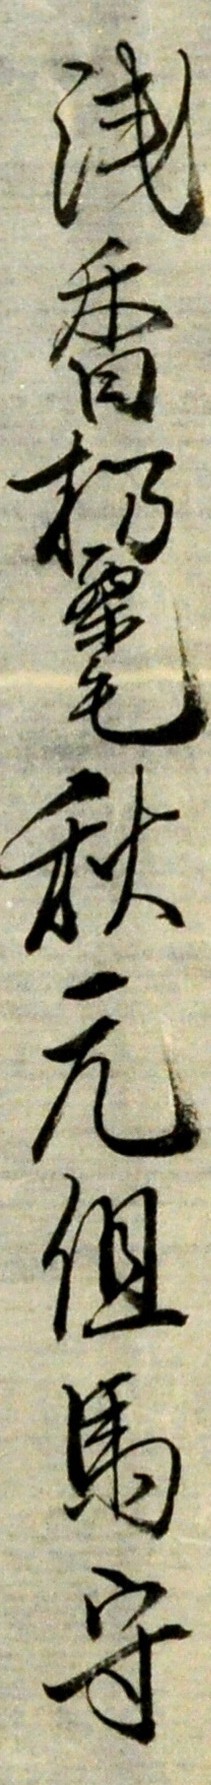浅香栃栗毛秋元但馬守
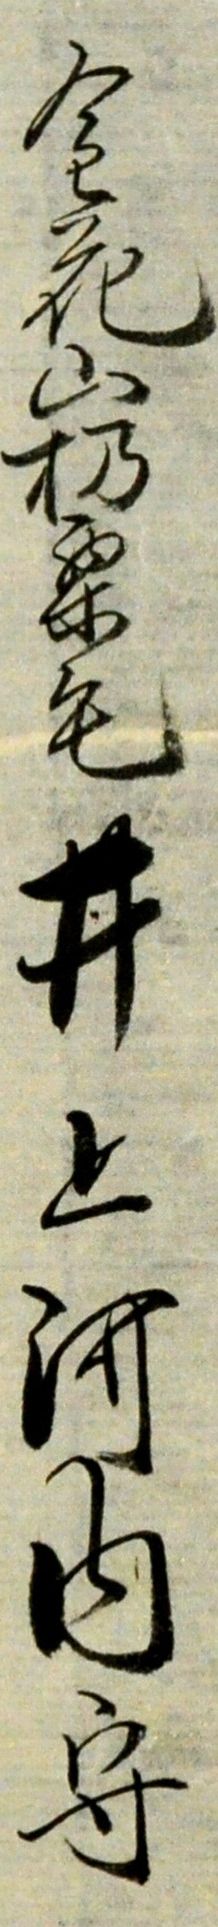金花山栃栗毛井上河内守
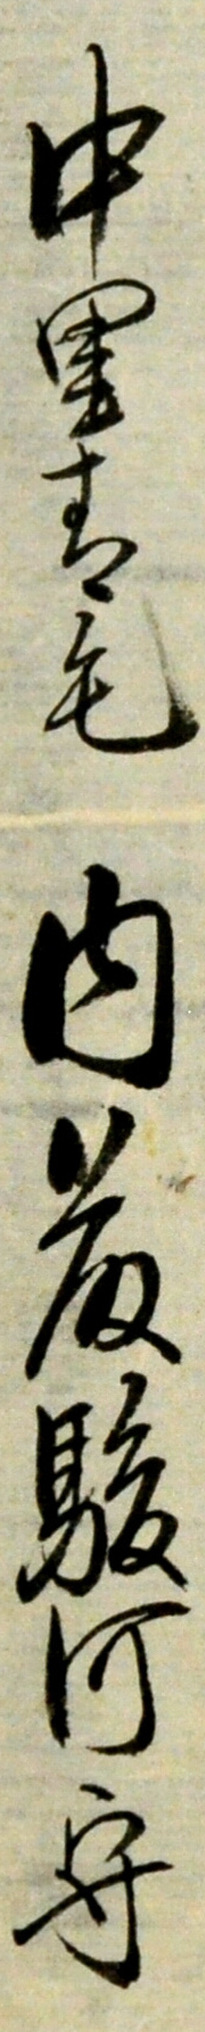中里青毛内藤駿河守
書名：吹上御庭ニ於テ乗馬上覧ノ節留書外
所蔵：伊那市立高遠町図書館・合同会社AMANE
